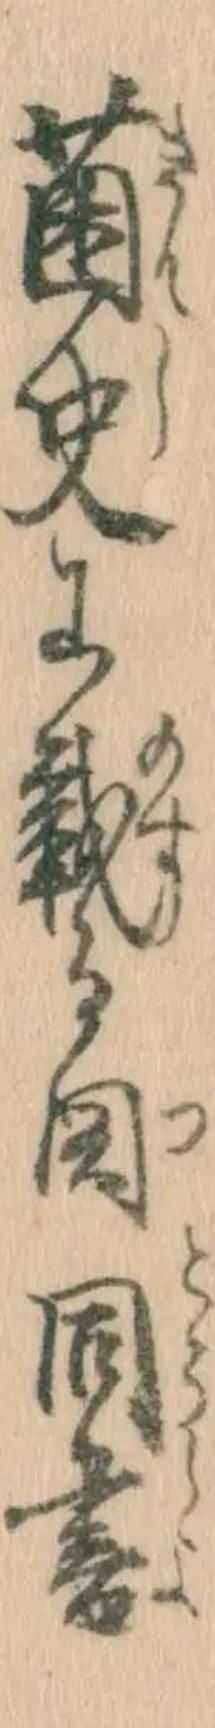菌史に載る図同書
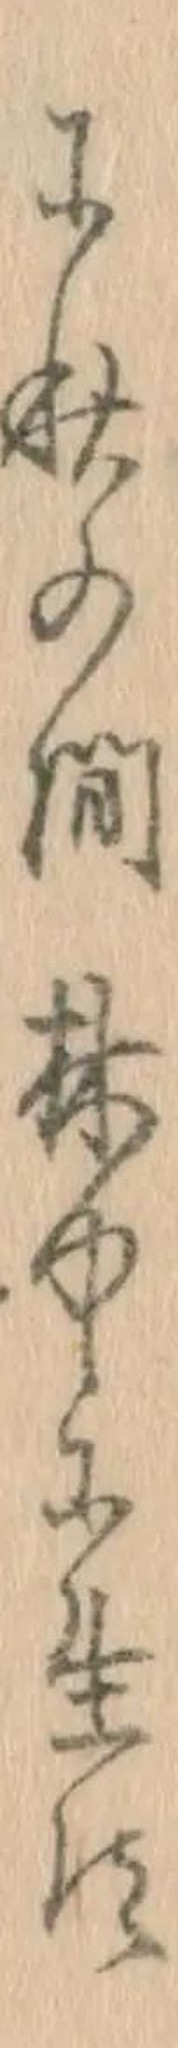に秋の間林中に生す
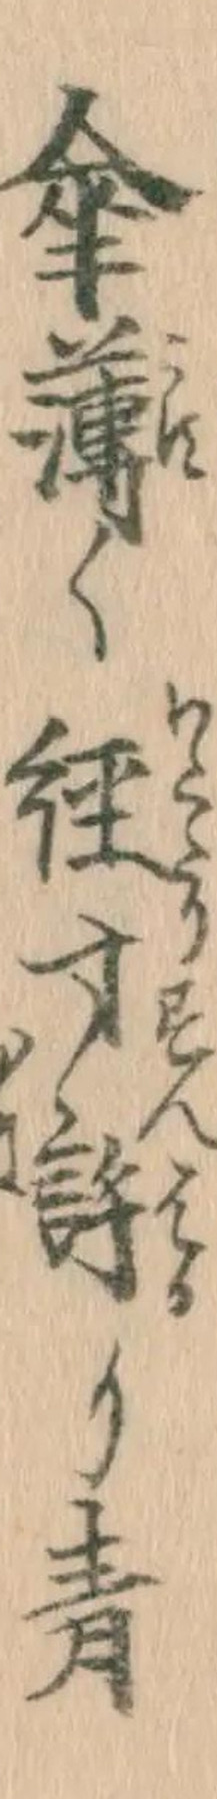傘薄く径寸許り青
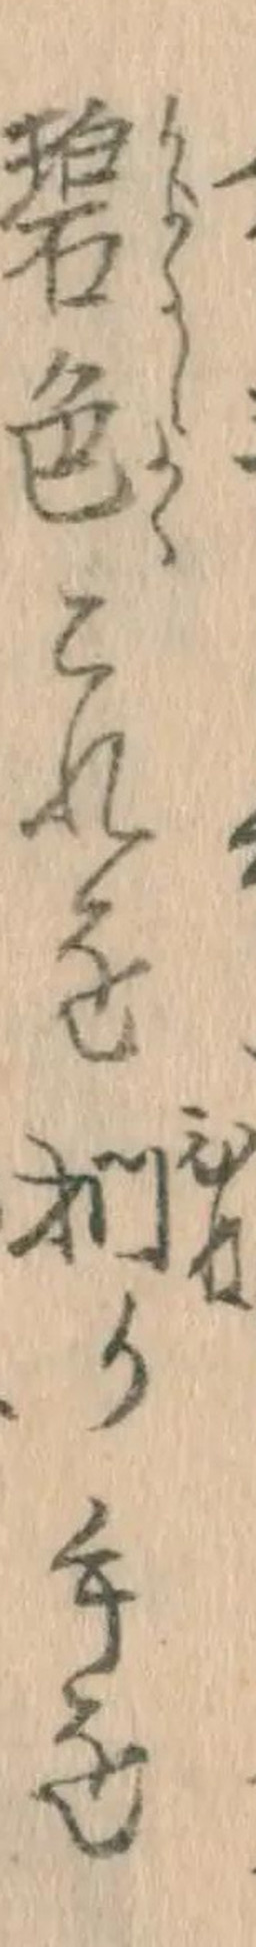碧色これを捫り手を
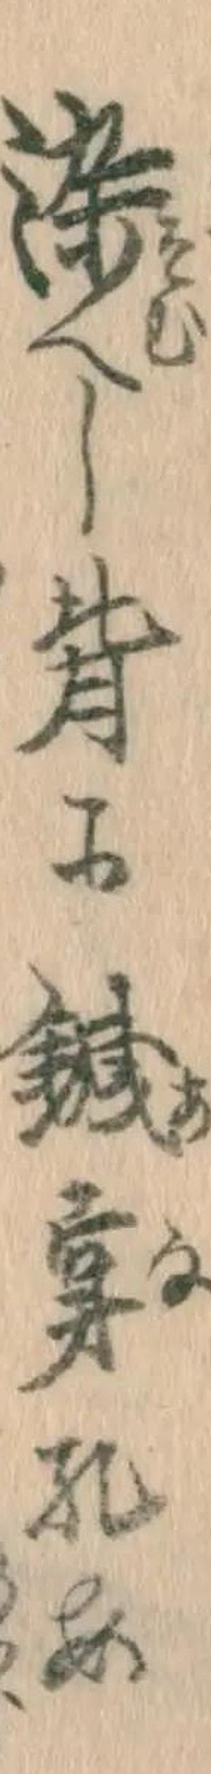染へし背に鍼穿孔あ
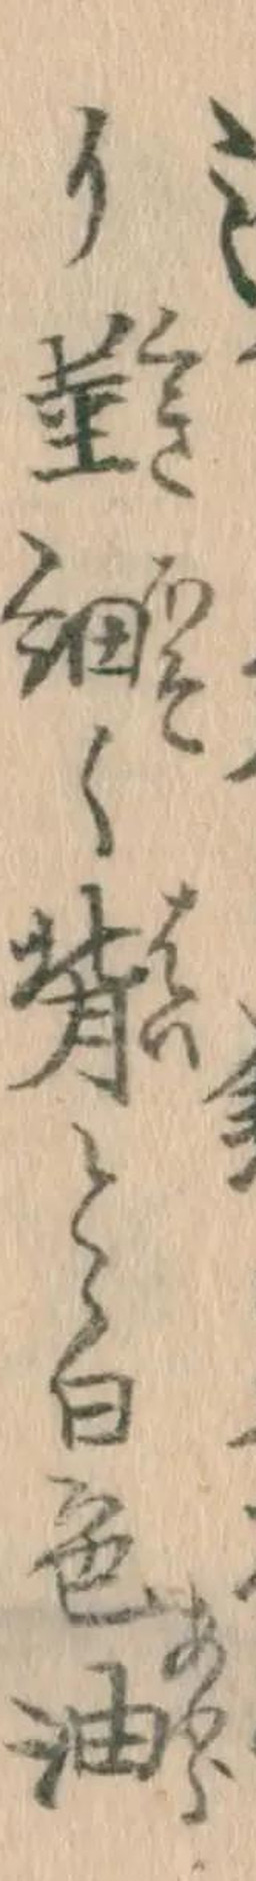り茎細く背と白色油
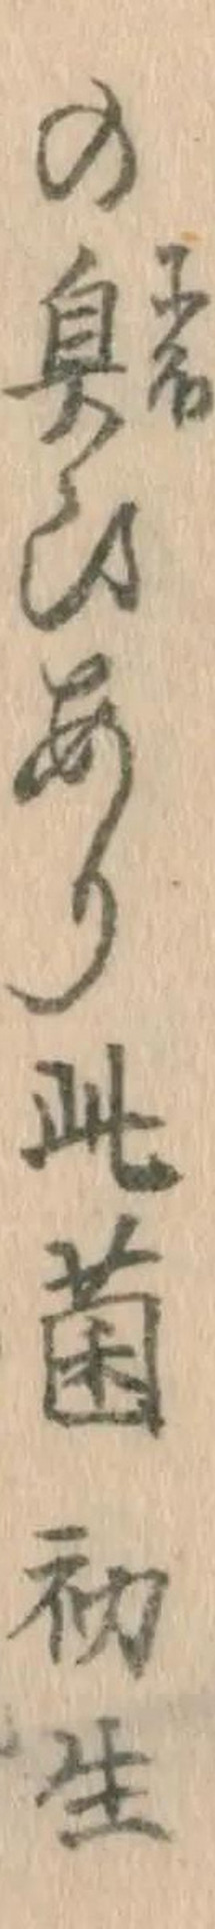の臭ひあり此菌初生
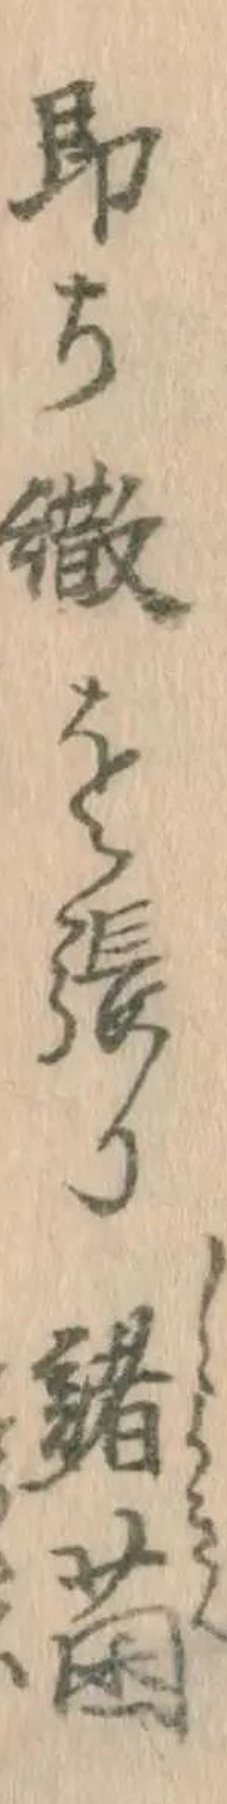即ち繖を張り諸菌
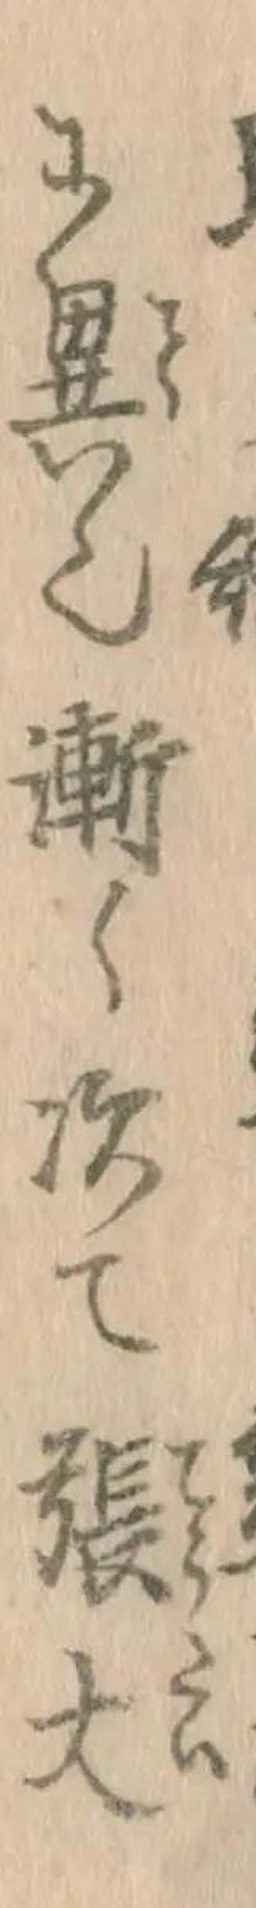に異也漸く次て張大
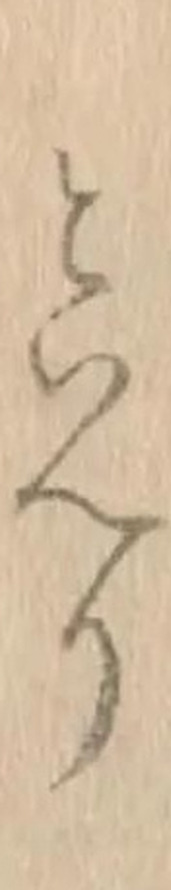といへり

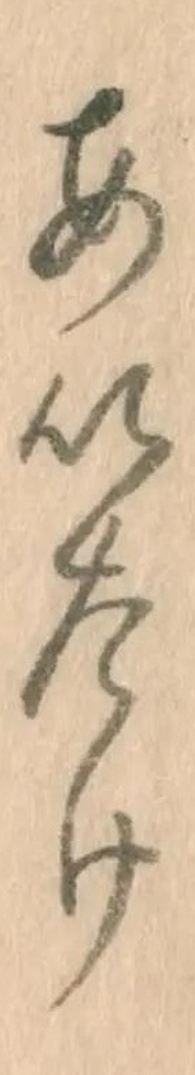あいたけ
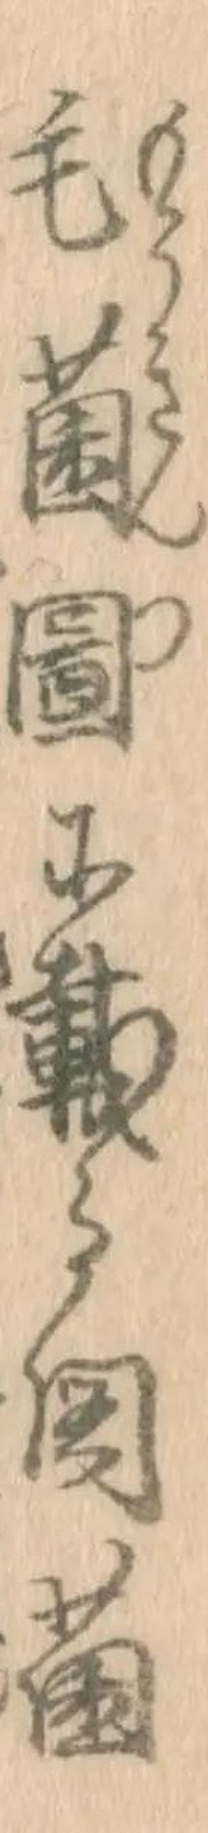毛菌図に載る図菌
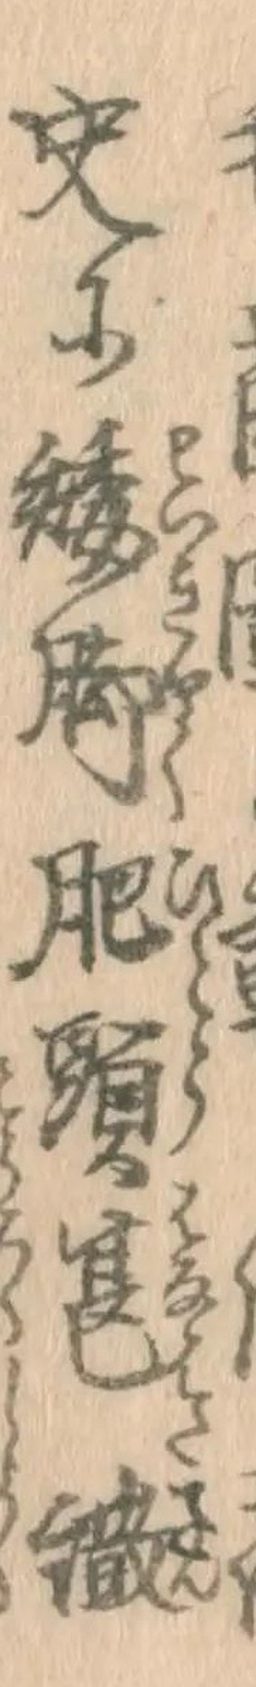史に矮脚肥頭甚繖
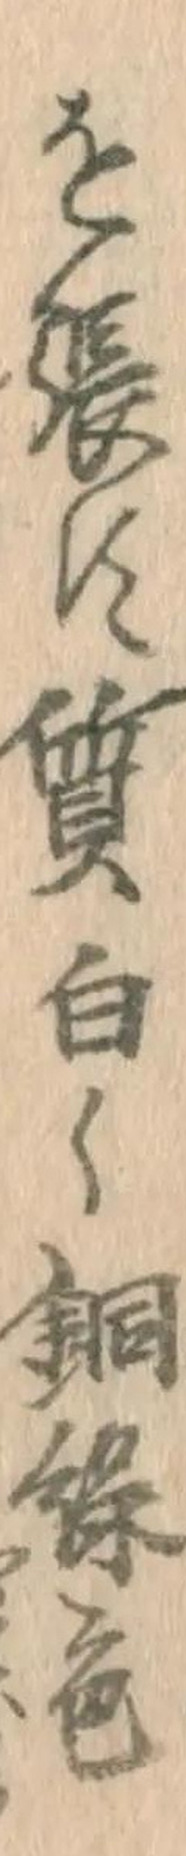を張す質白く銅緑色
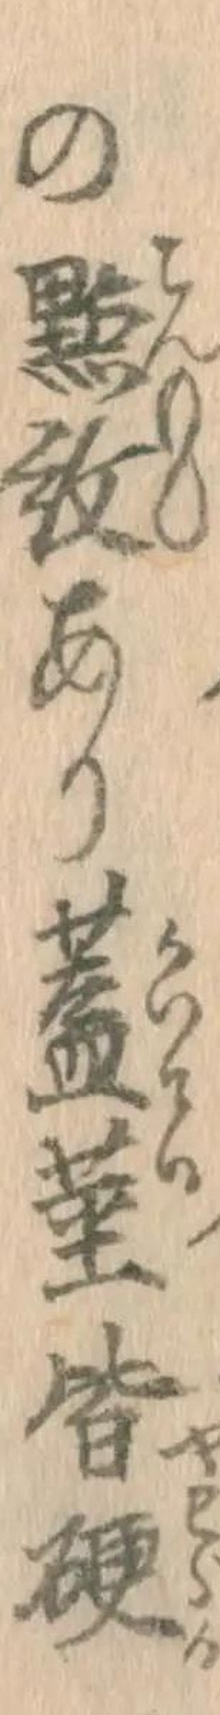の点紋あり蓋茎皆硬
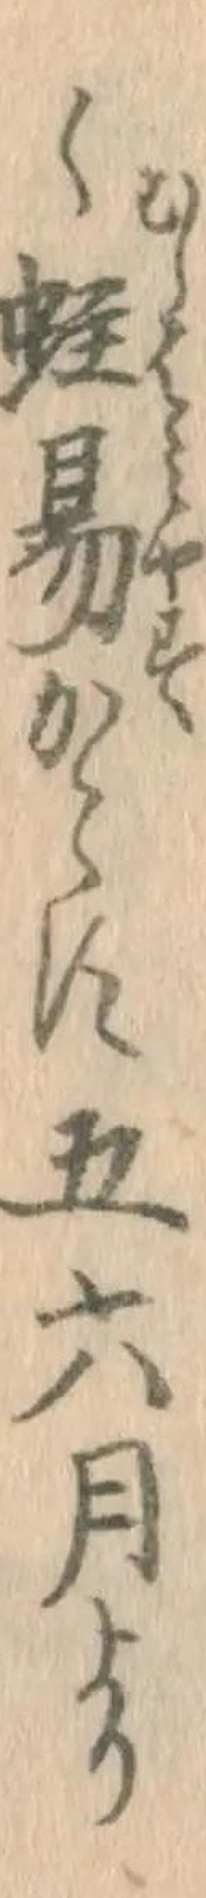く蛀易からす五六月より
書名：本草図譜. 巻55-57
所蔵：国立国会図書館 National Diet Library, JAPAN
